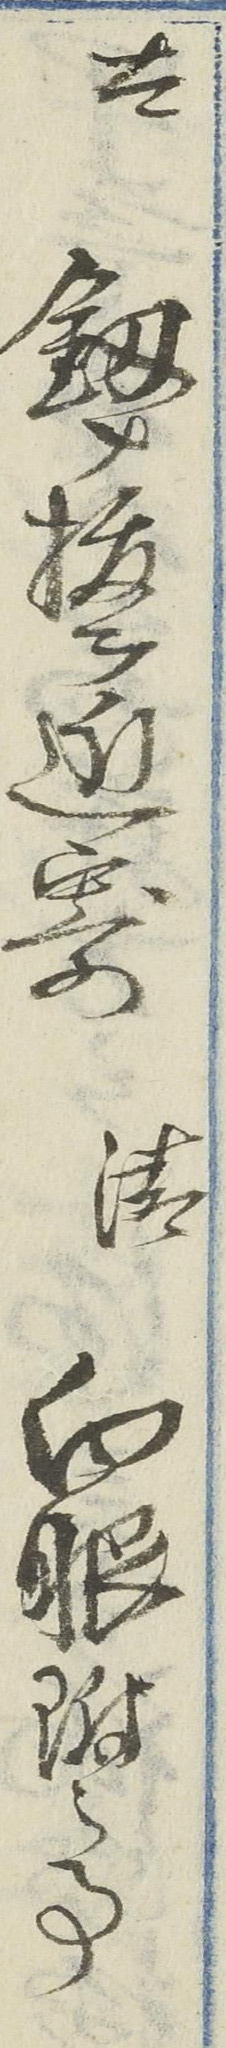太釼ヲ抜テ近寄清白眼附之事
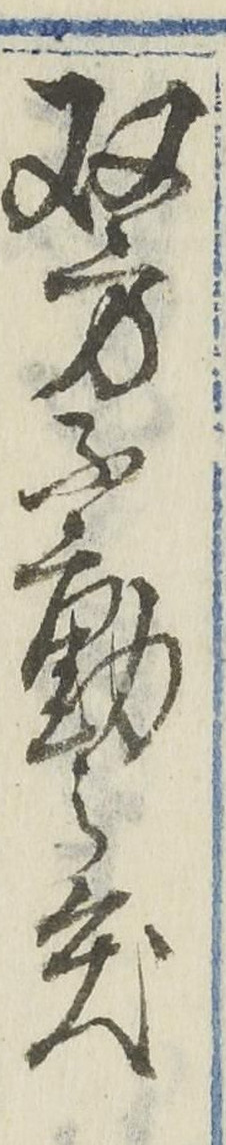双方不動之知
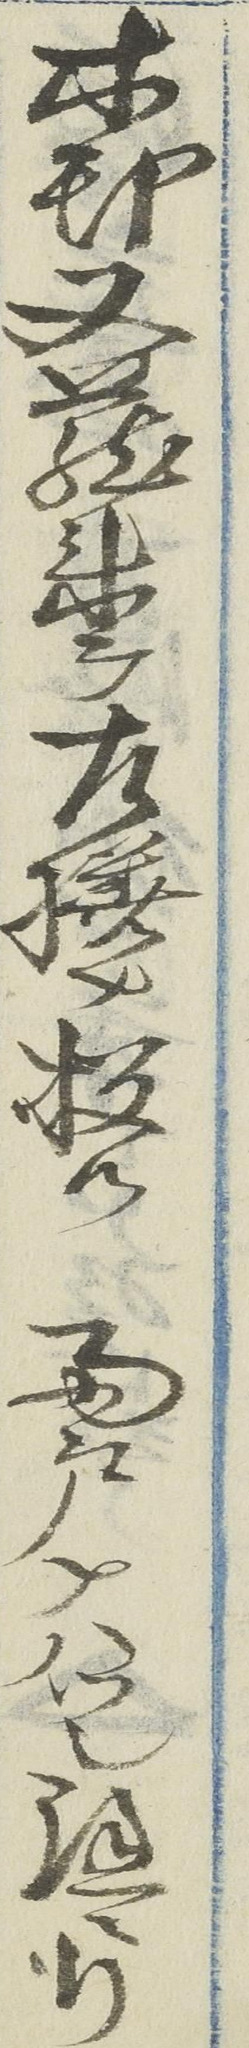木邨又蔵来テ左膳ヲ救ル雨戸ヲハツシ庭ニ行
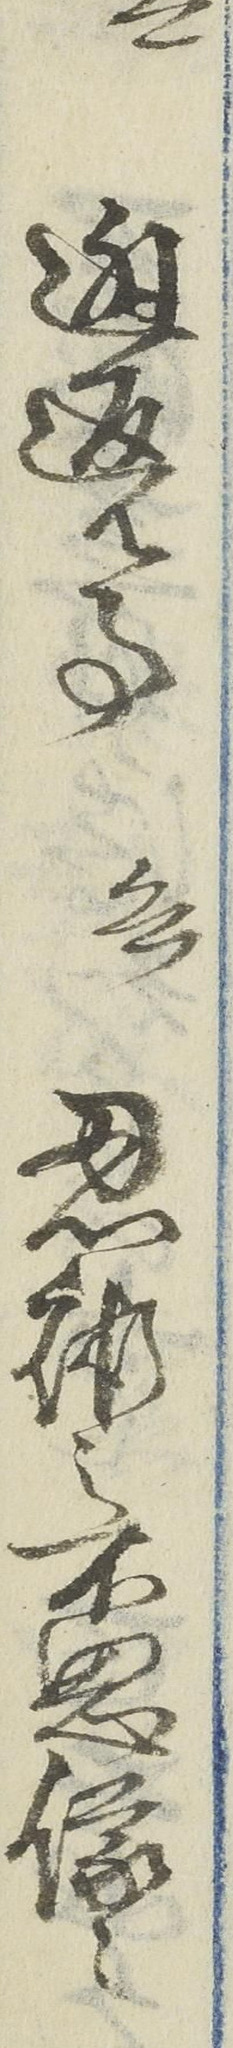太逃返ル事兵忍術之不思議也

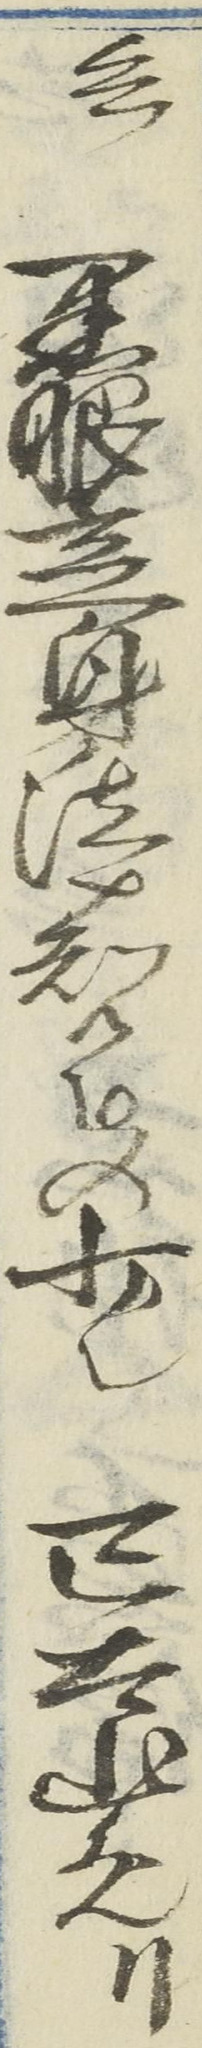兵黒眼定身ノ法ヲ知ルもの少シ已太山めり
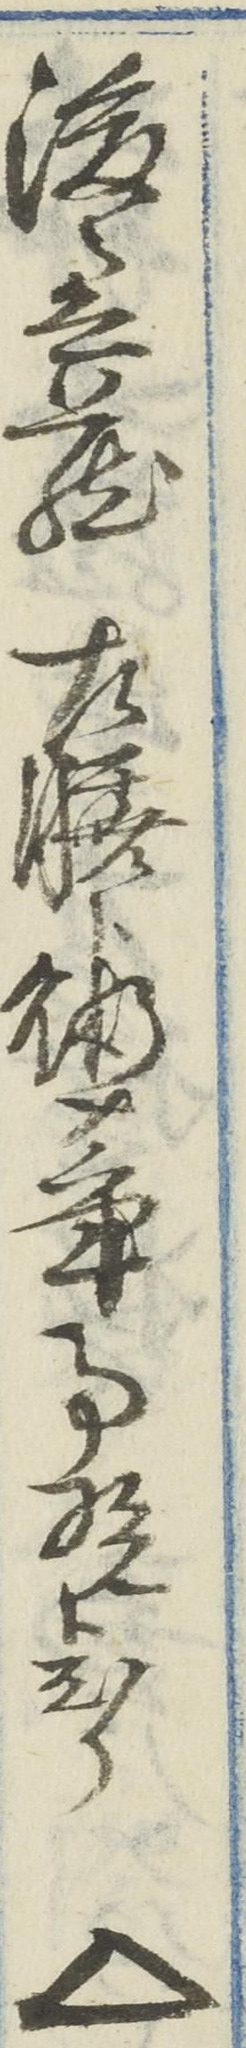後〻兵蔵左膳ト術ヲ争事有ルト云ウ△
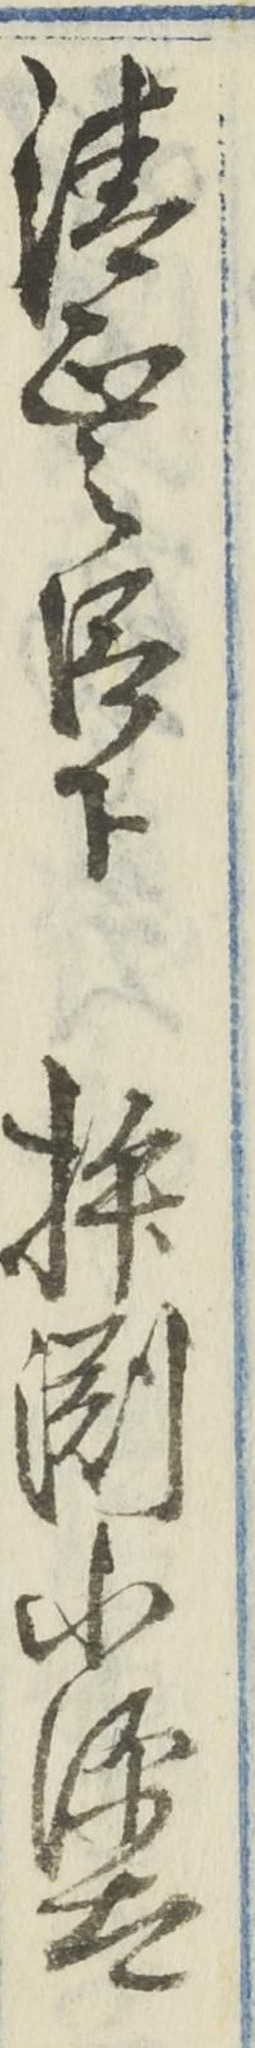清正之臣下杵渕小源太
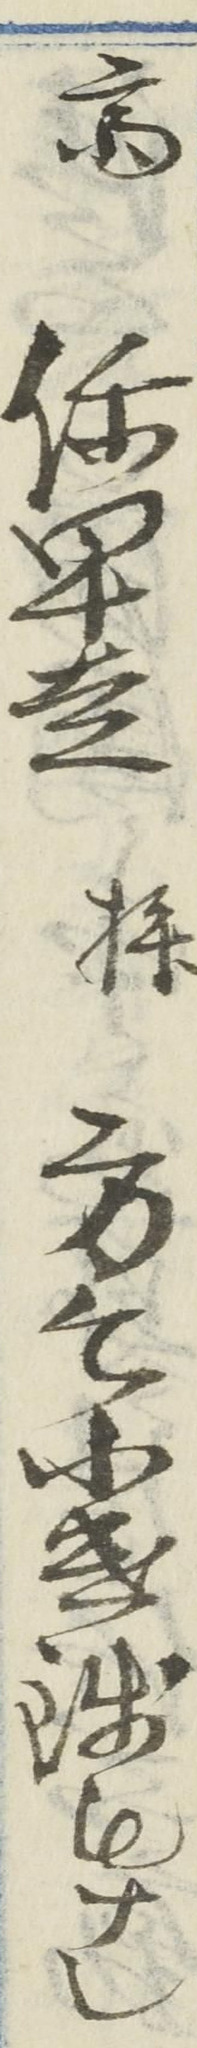斉弥早走杵方今小遣残モナシ
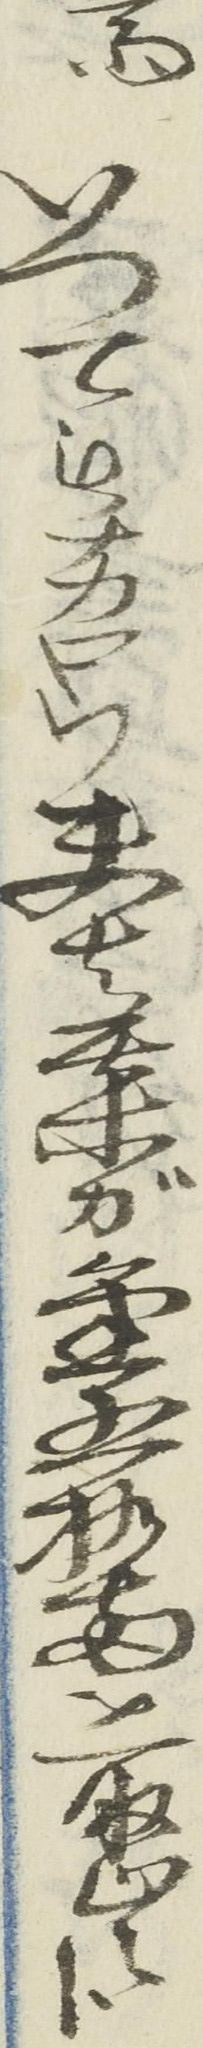斉いつてもナカロウ夫は某が金五拾両ヲ取出也ト
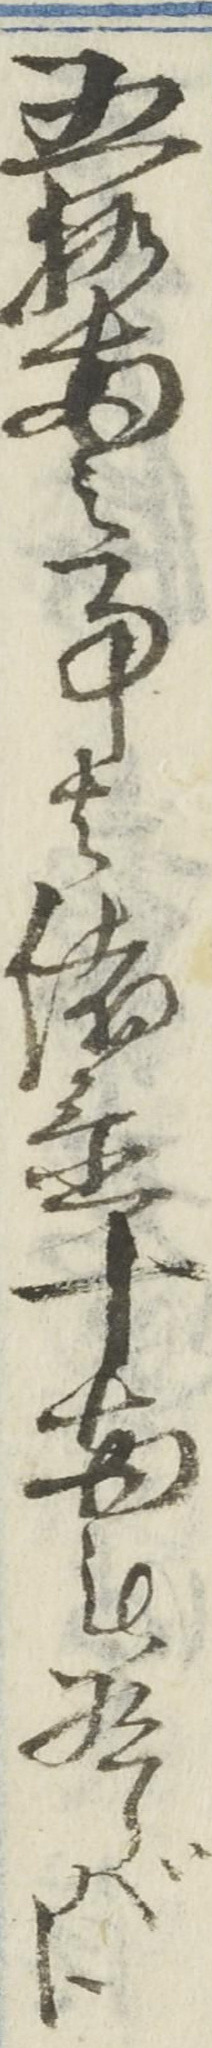五拾両之事は偖置十両も有ラバト
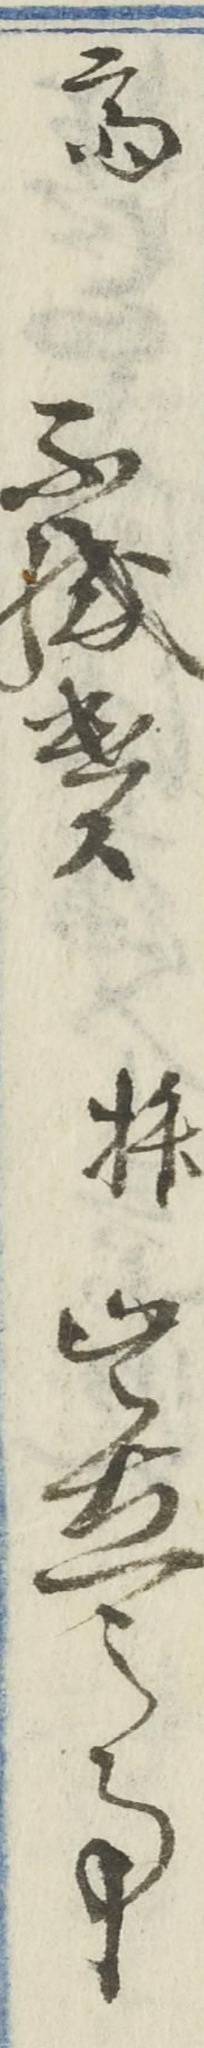斉不残遣ス杵無恵之事
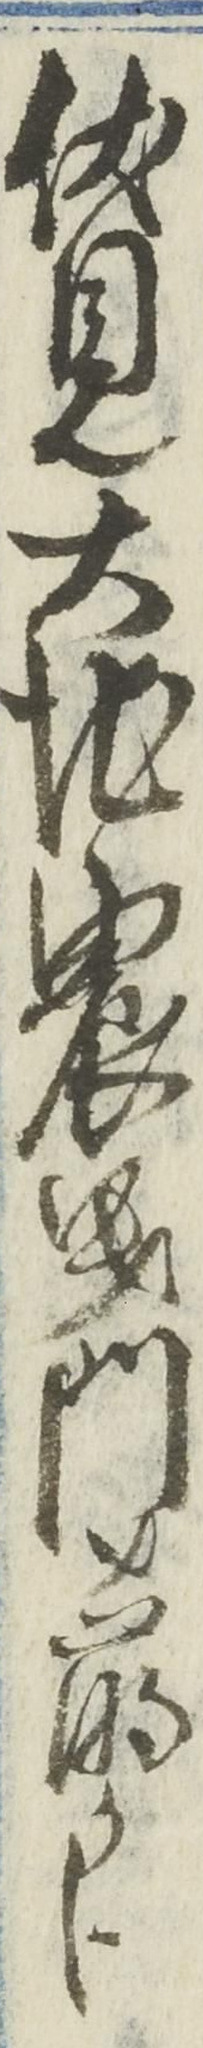伏見大地震閉門ヲ崩リト
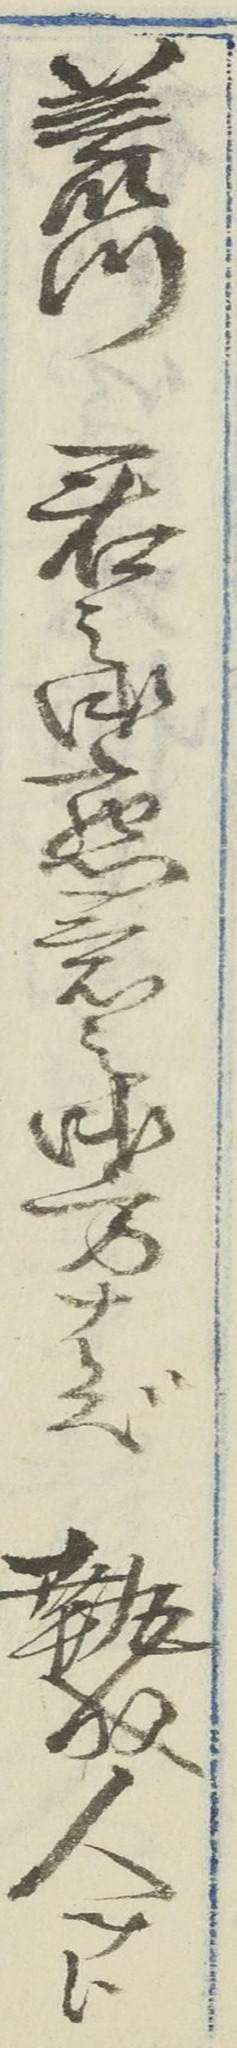荒川君之御懇意之御方ナラズ執成人ヲト
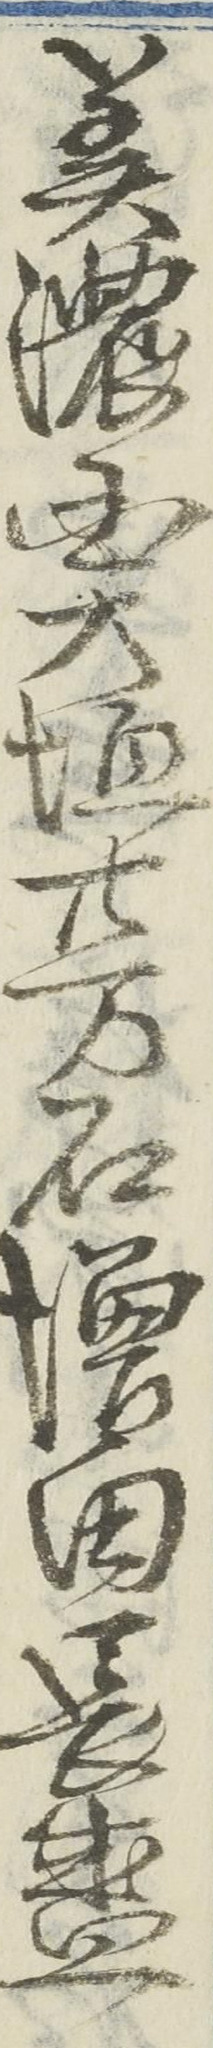美濃国大垣廿万石増田長盛
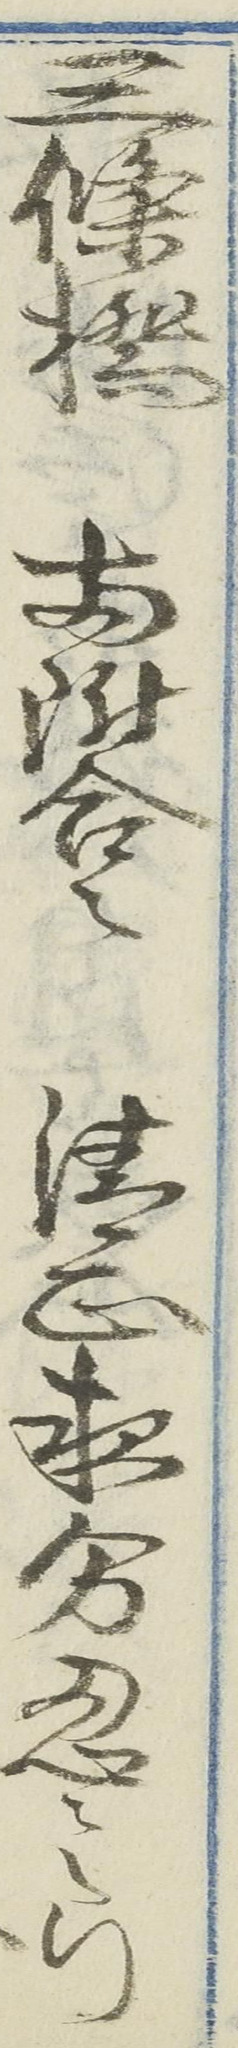三條橋両附合之清正夜分忍之行
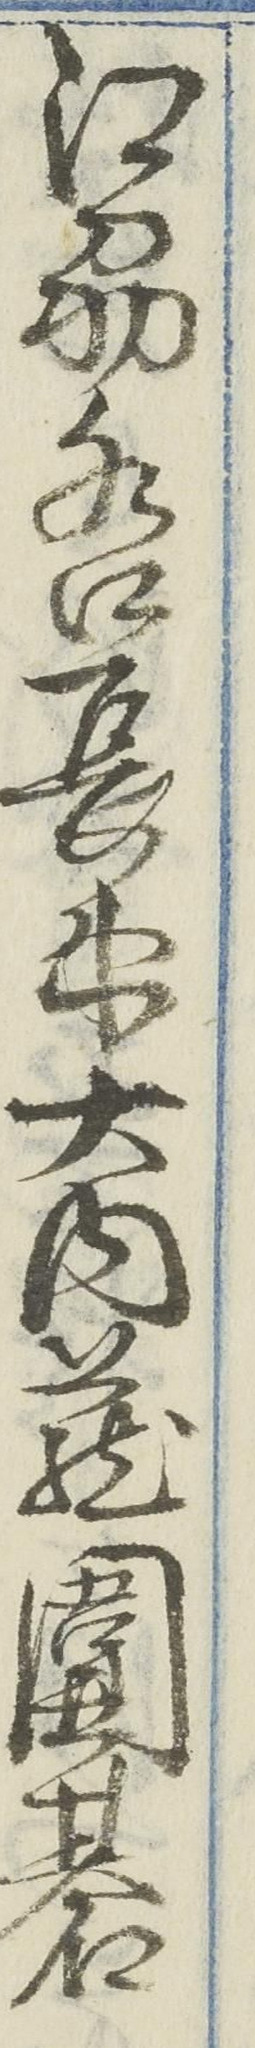江州水口長束大内蔵囲碁
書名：伏水大地震
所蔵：東京大学地震研究所図書室 Earthquake Research Institute Library, The University of Tokyo, JAPAN
